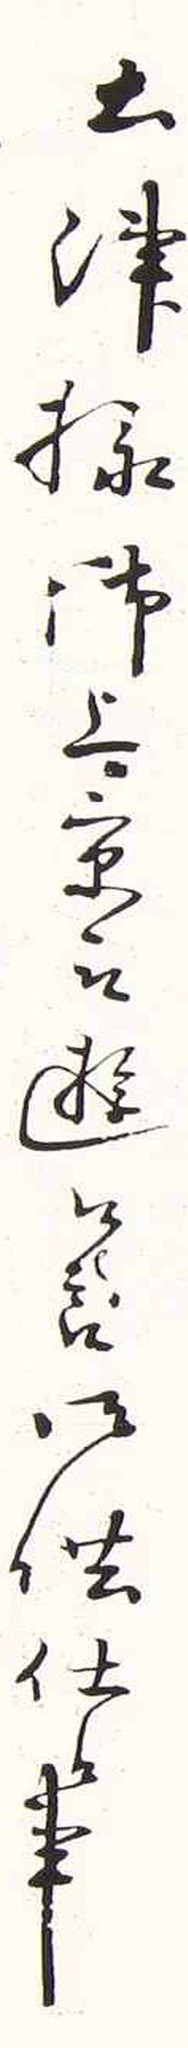土津様御上京被遊候節御供仕候事
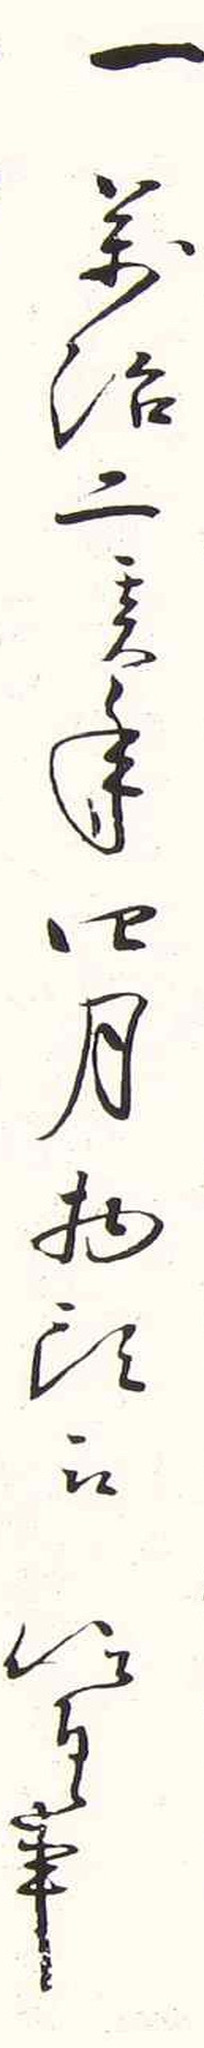一万治二亥年四月物頭被仰付候事
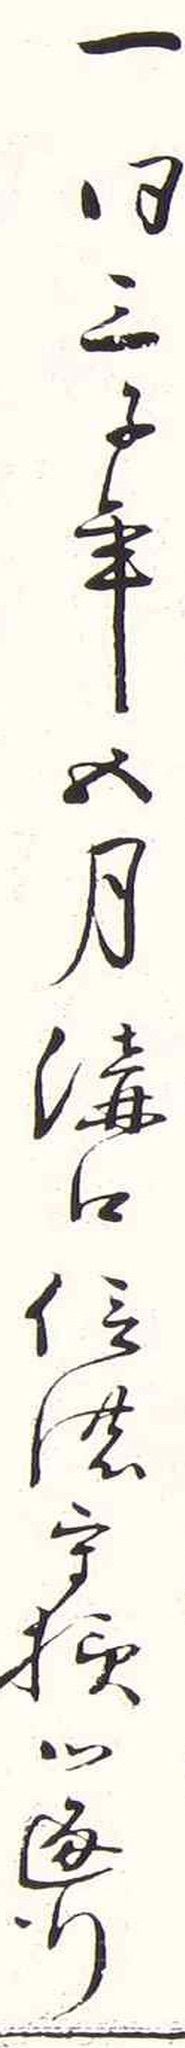一同三子年五月溝口信濃守様御通行
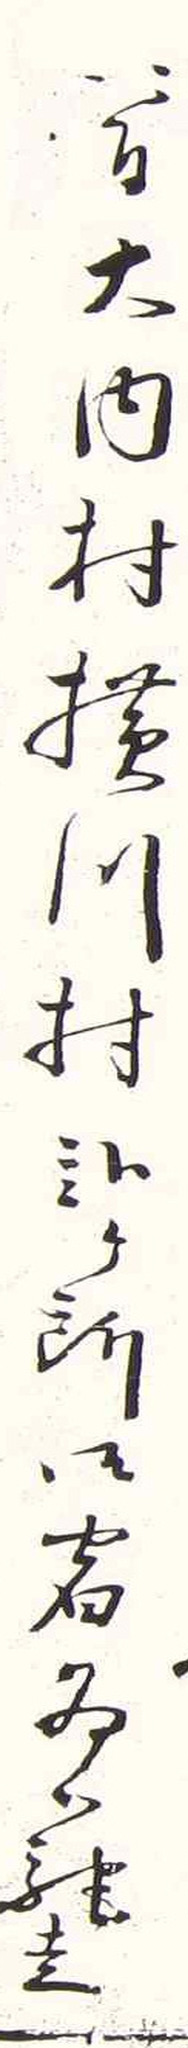ニ付大内村横川村弐ケ所御宿為御馳走

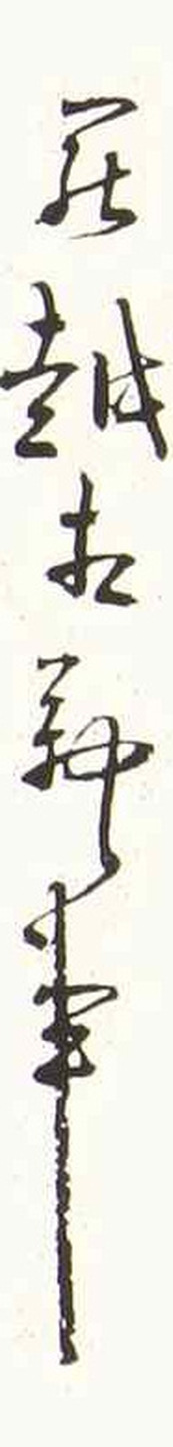罷越相勤候事
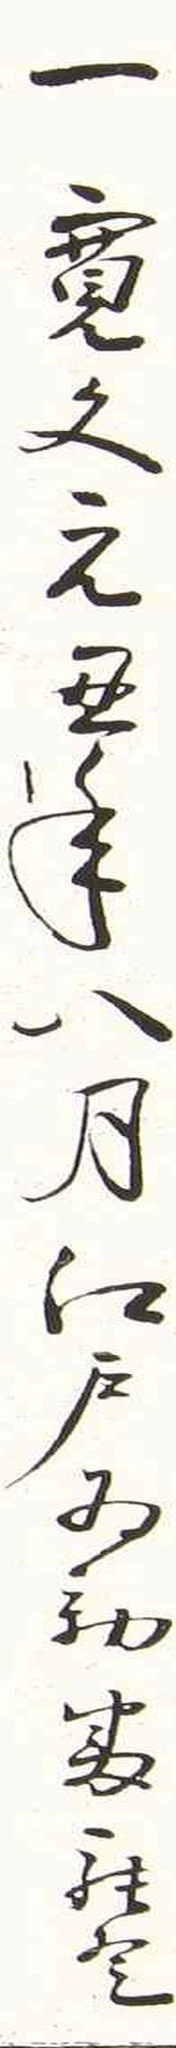一寛文元丑年八月江戸為勤番罷登
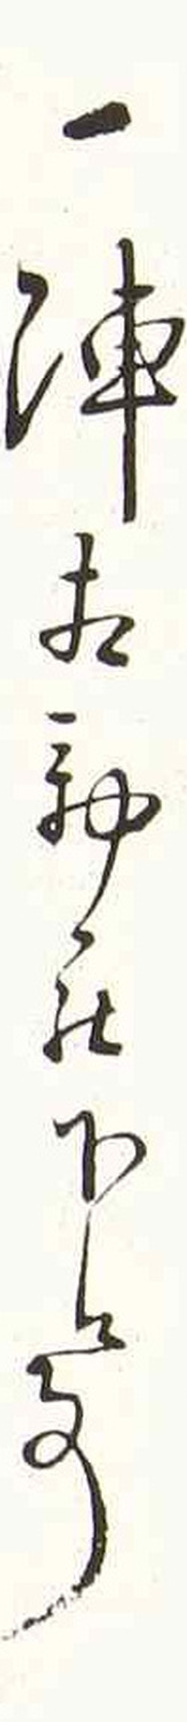一陣相勤罷下候事
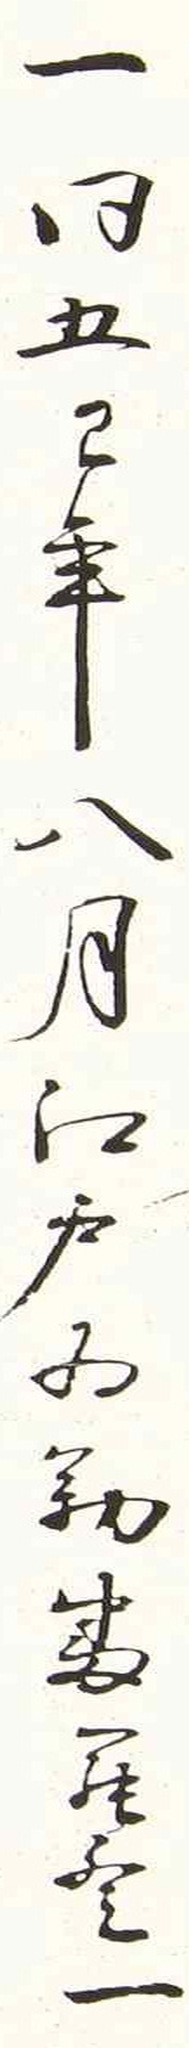一同五巳年八月江戸為勤番罷登一
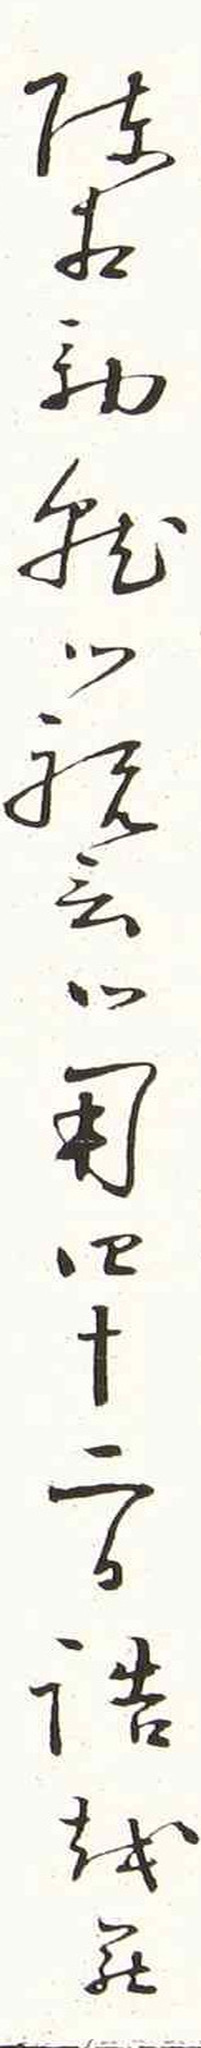陣相勤就御祝言御用四十二日詰越罷
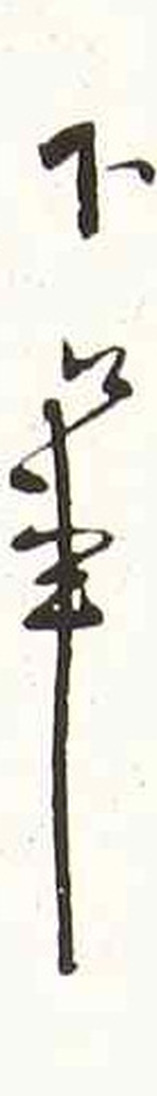下候事
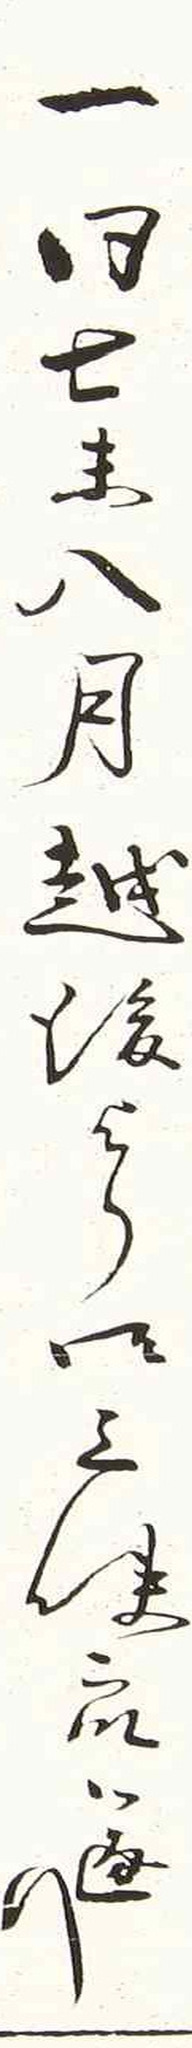一同七未八月越後より御上使衆御通行
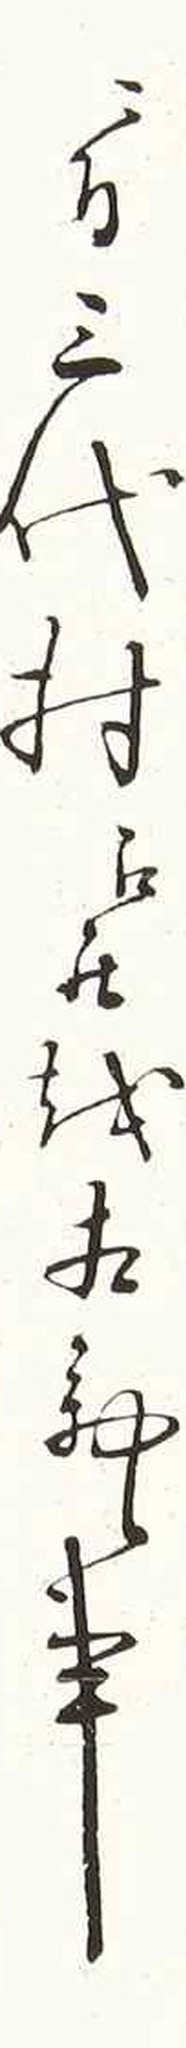ニ付三代村江罷越相勤候事
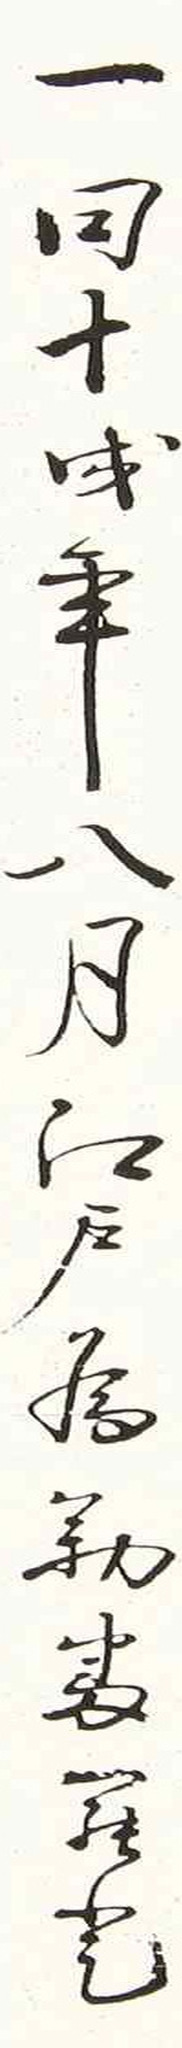一同十戌年八月江戸為勤番罷登
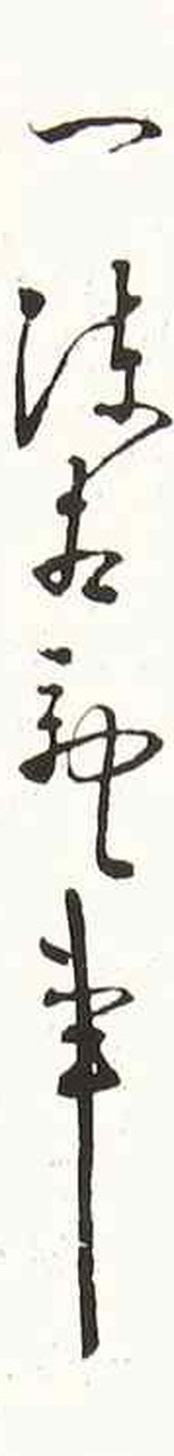一陣相勤候事
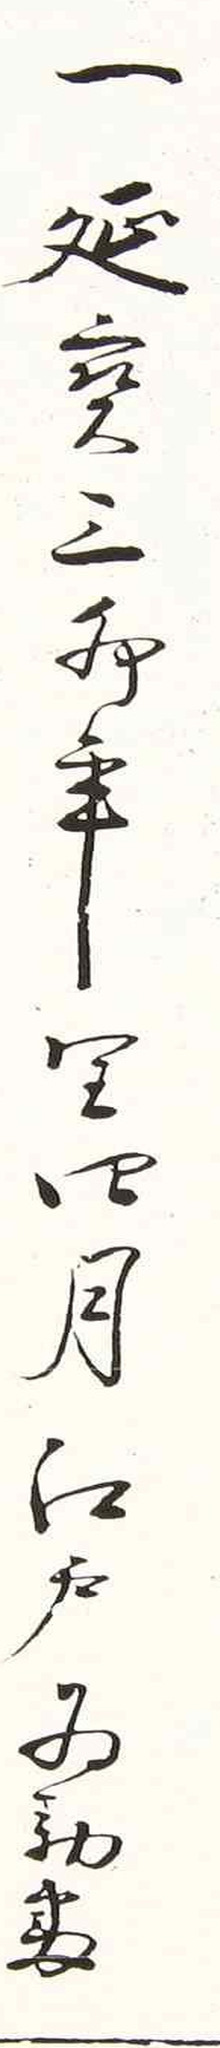一延宝三卯年閏四月江戸為勤番
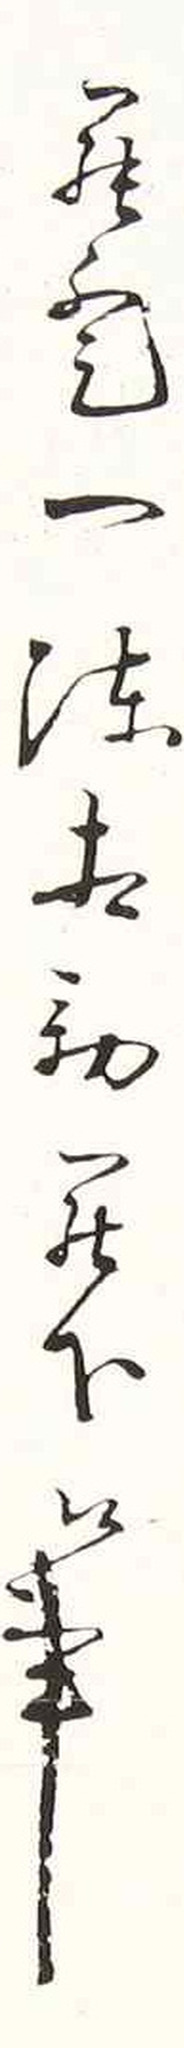罷登一陣相勤罷下候事
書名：諸士系譜　巻之357　す之部7
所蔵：会津若松市立会津図書館
